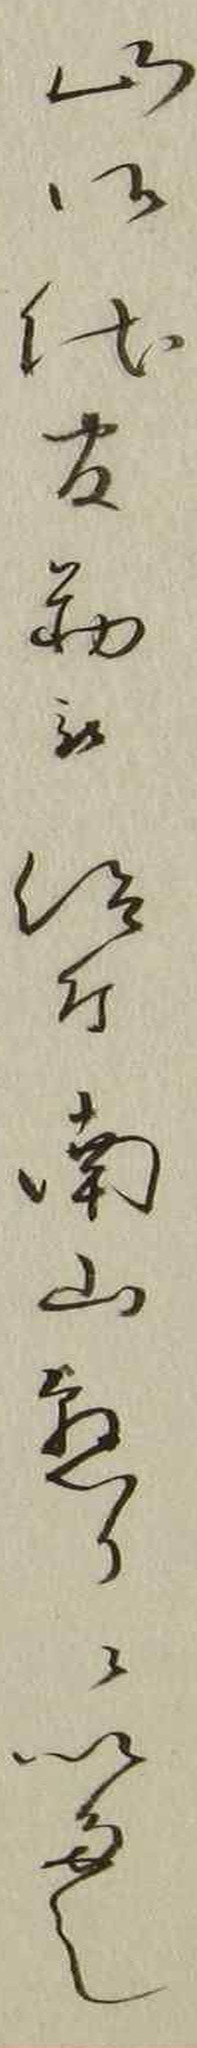止御代官勤被仰付南山懸りニいたし
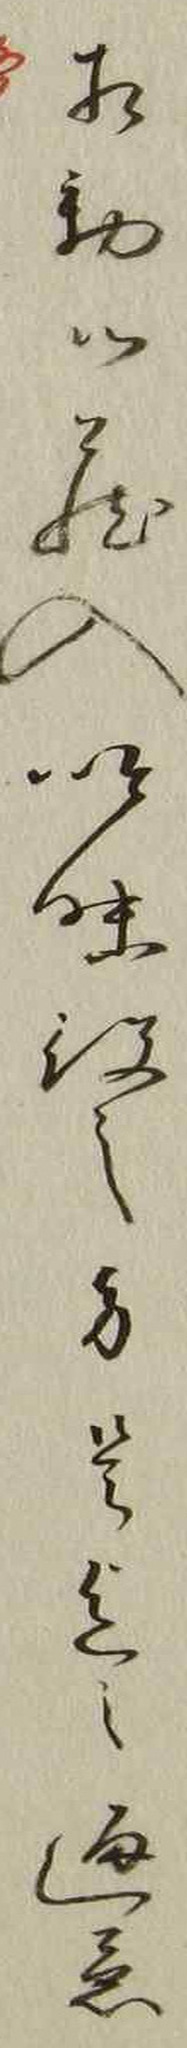相勤御蔵入吟味役之方是迄之通兼
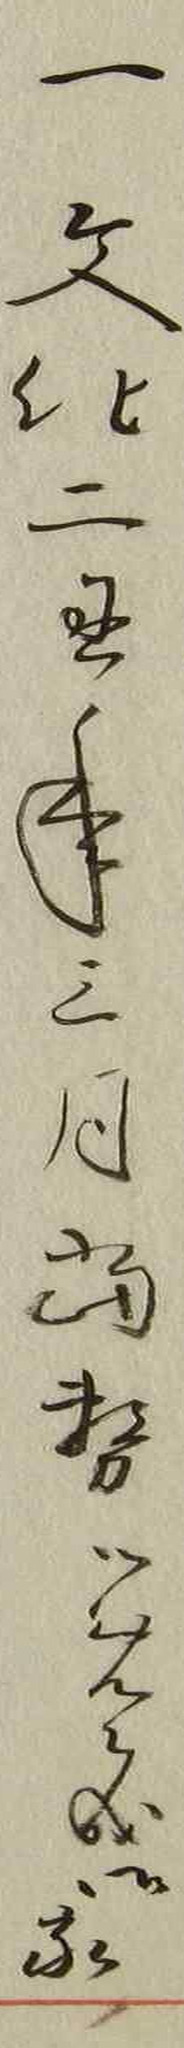一文化二丑年三月当務御免被成御家
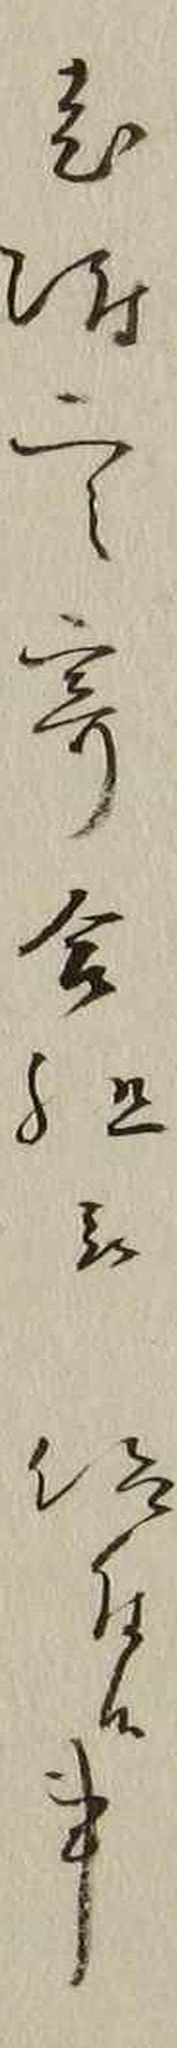老附二之寄合組被仰付候事
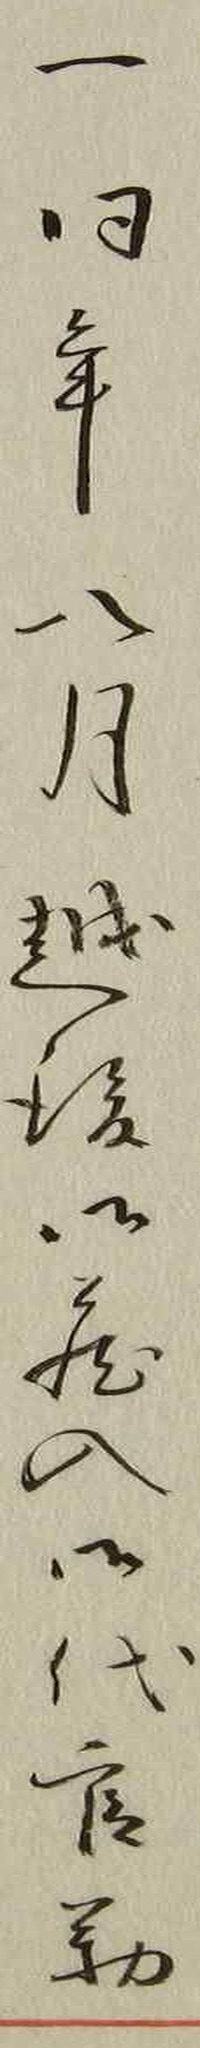一同年八月越後御蔵入御代官勤
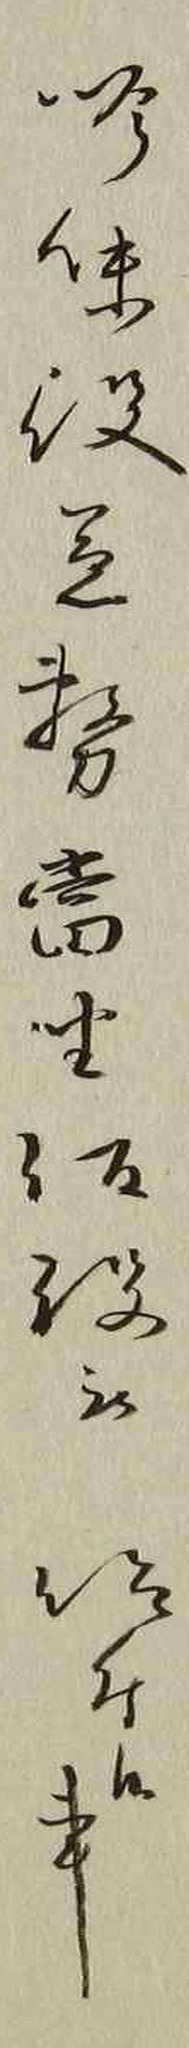吟味役兼務当座仮役被仰付候事
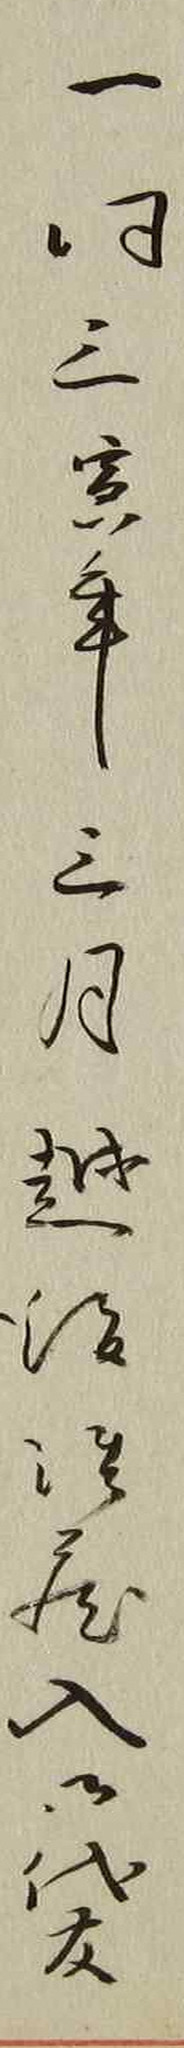一同三寅年三月越後御蔵入御代官
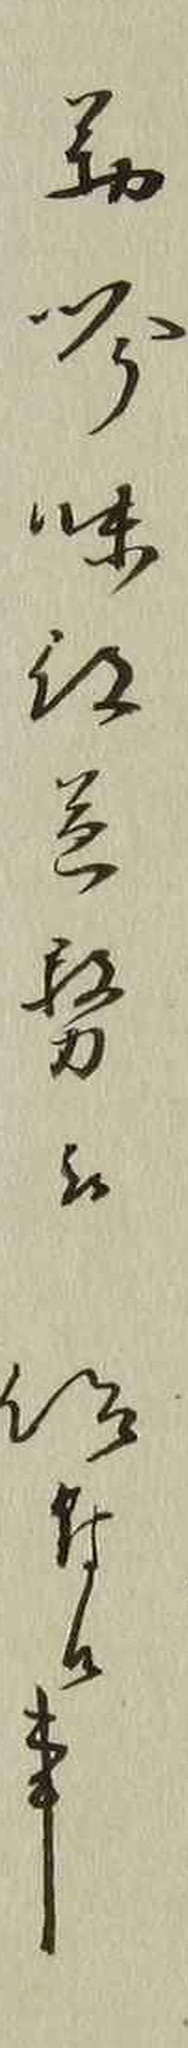勤吟味役兼務被仰付候事
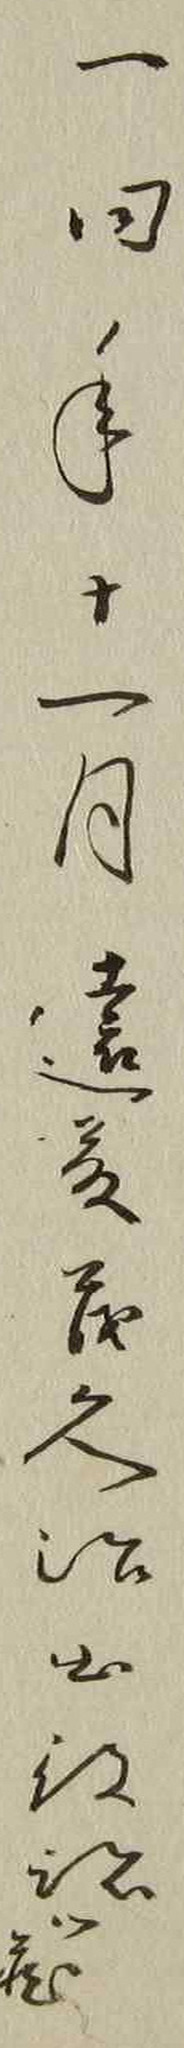一同年十一月遠藤茂久治出役跡御蔵
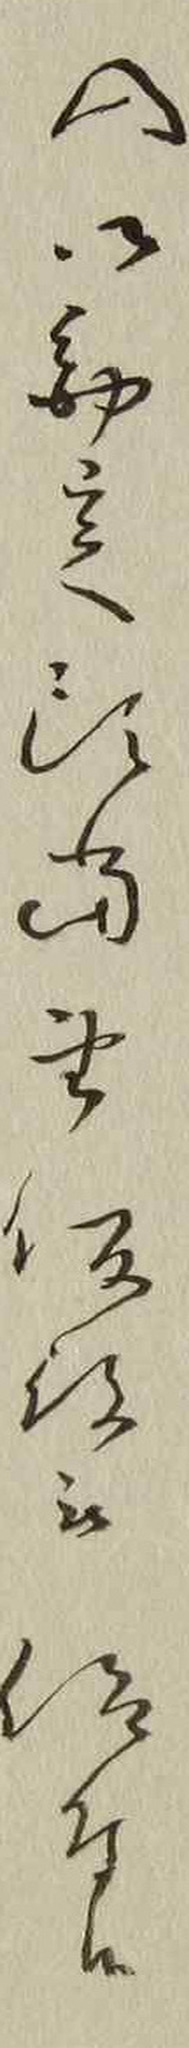入御勘定頭当座仮役被仰付候
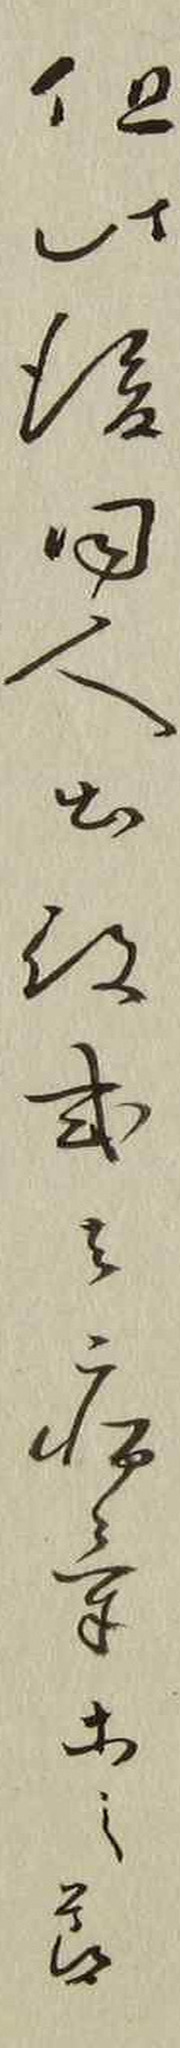但此後同人出役或者病気等之節
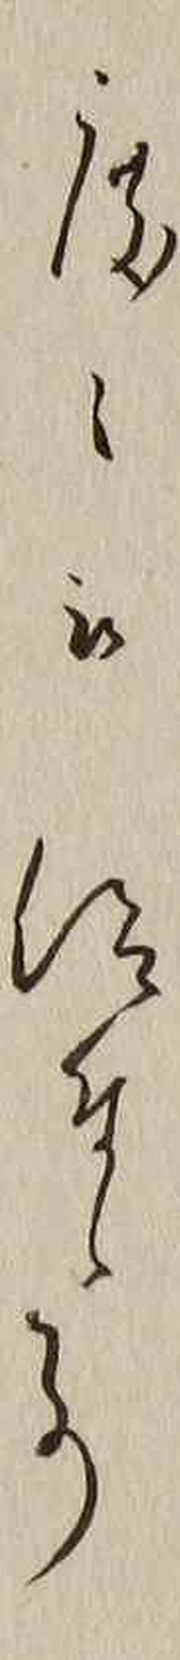度々被仰付候事
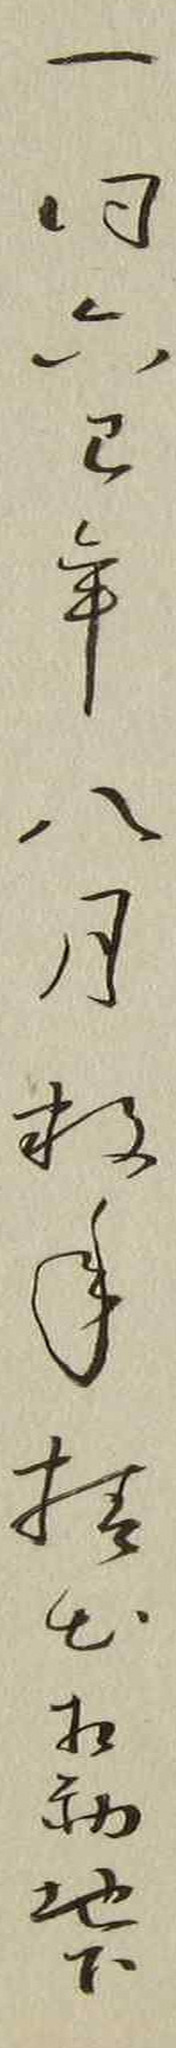一同六巳年八月数年精出相勤地下
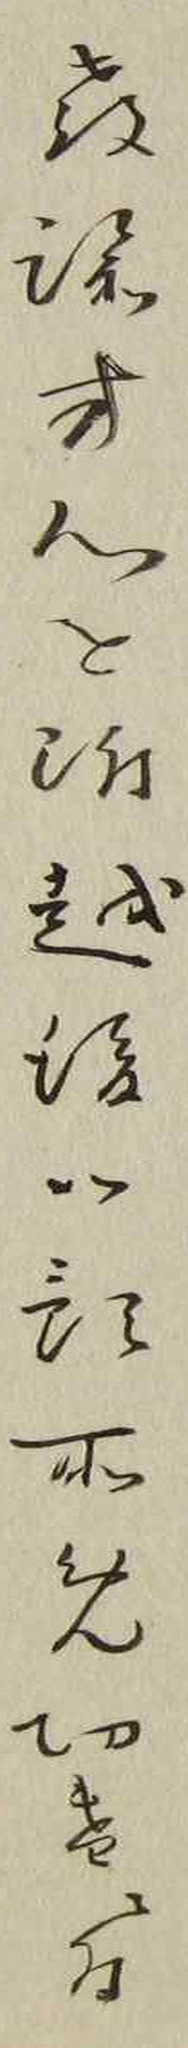教諭方心を附越後御預所免切替ニ付
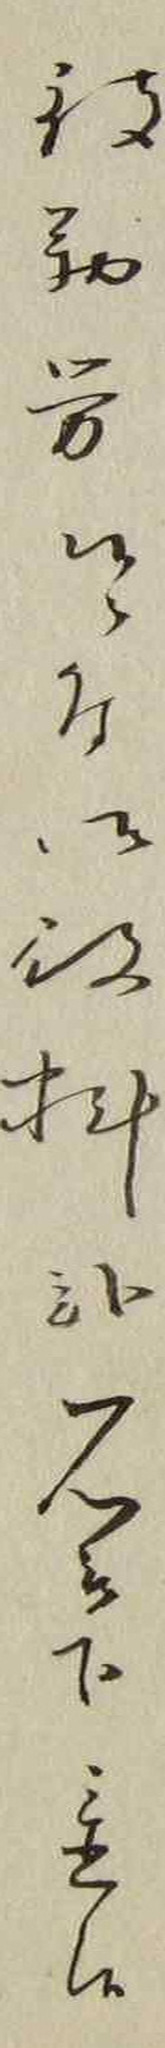致勤労候ニ付御役料弐石被下置候

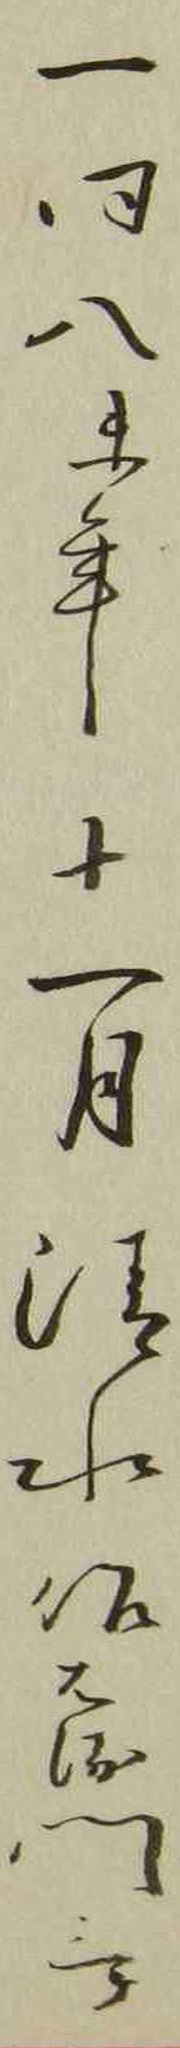一同八未年十一月清水作右衛門三ケ
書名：諸士系譜　巻之8　い之部8
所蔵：会津若松市立会津図書館
